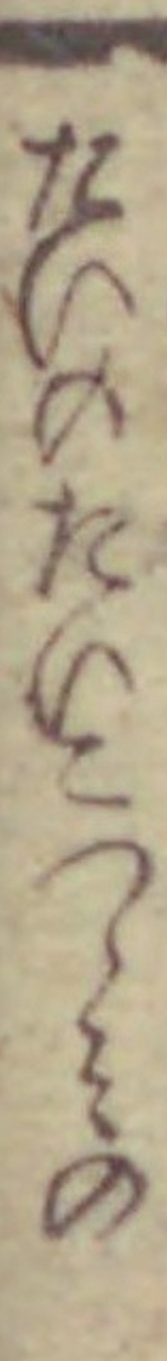たいのたいこつゝみの
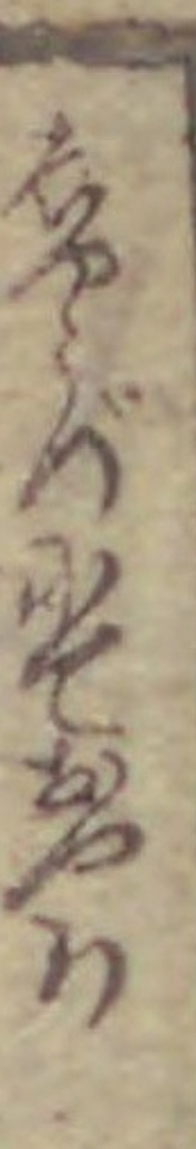しやうづにておつり
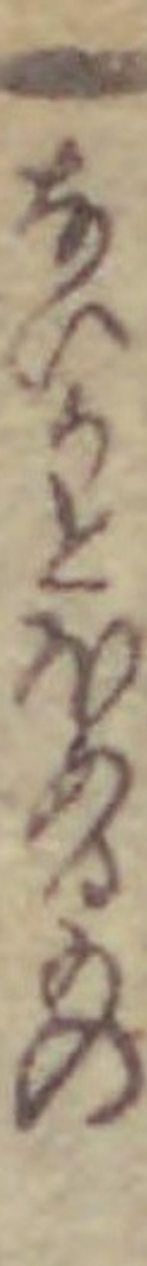ないかとほめるもの
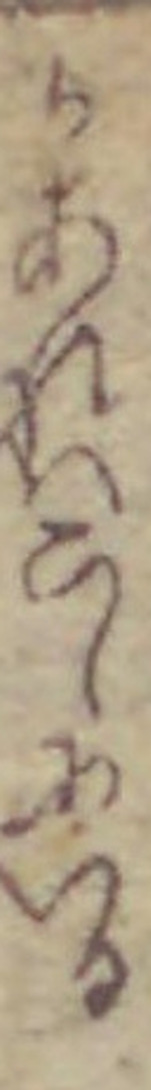かあれはこゝにいる
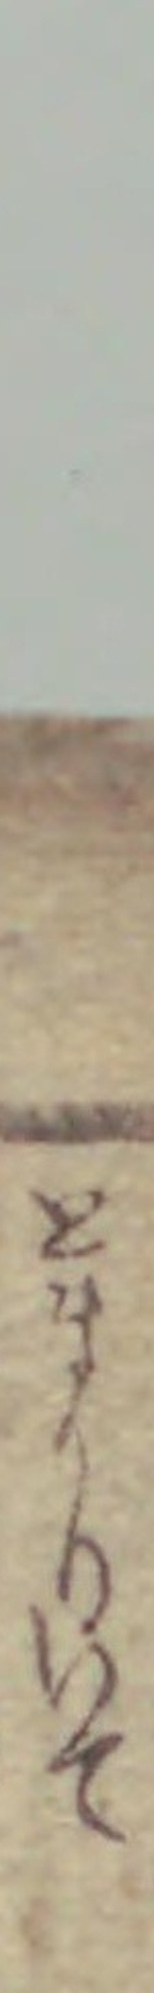とまかりいて
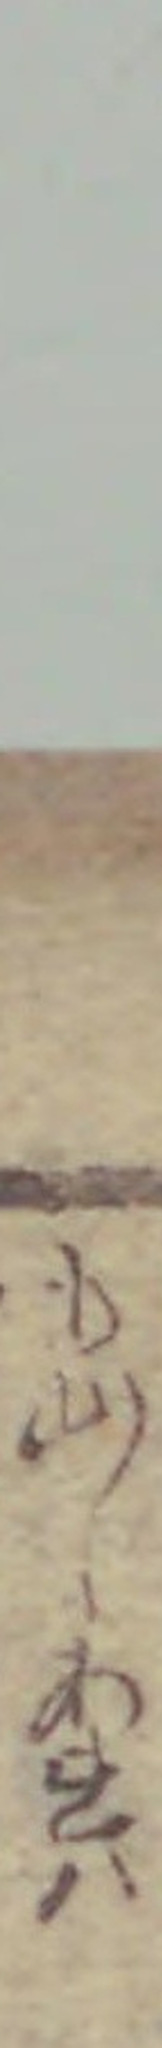も山〳〵あれは
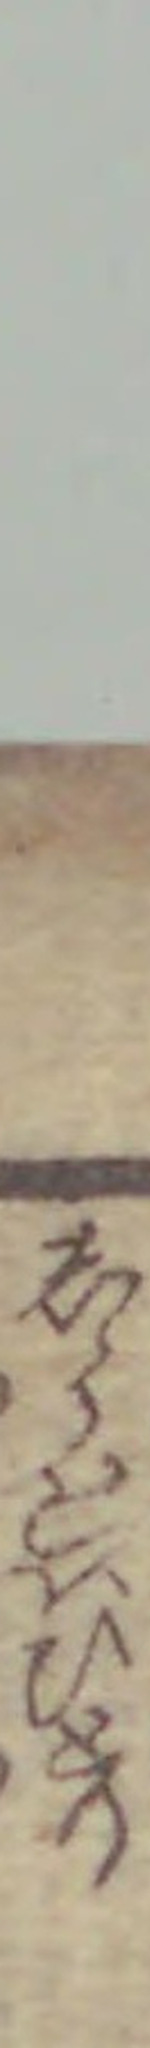しうとはひとり
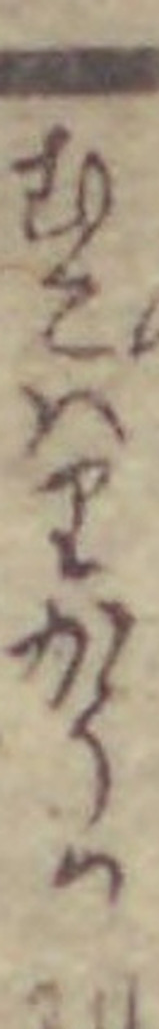むこはりかうか
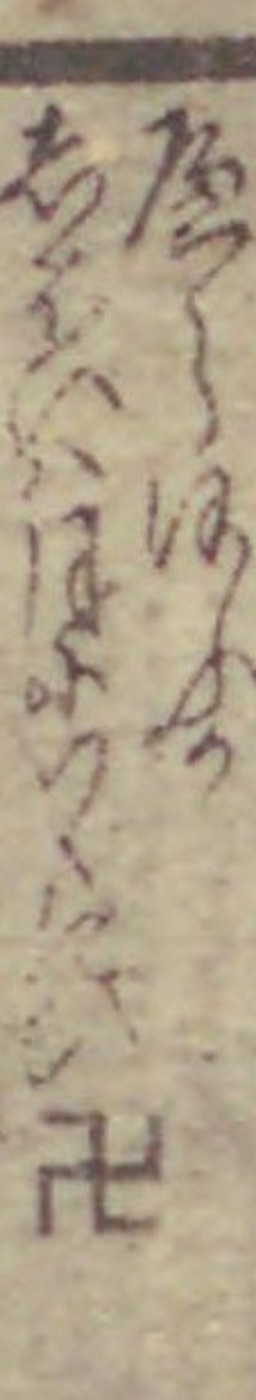しばいは月にいくたひ
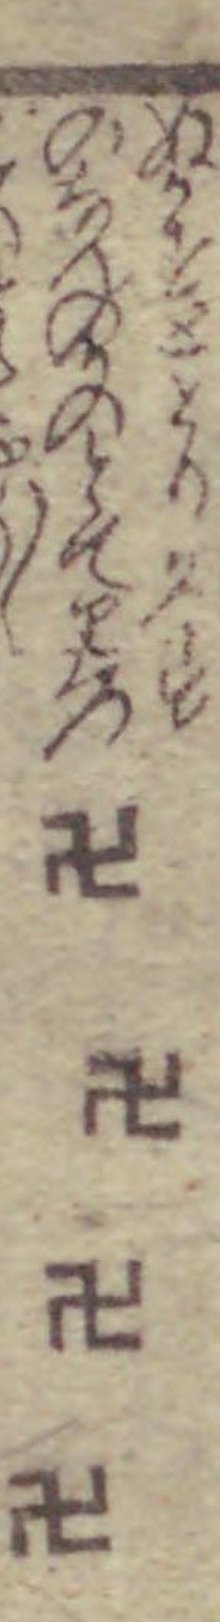のなんのかのとてりくつ
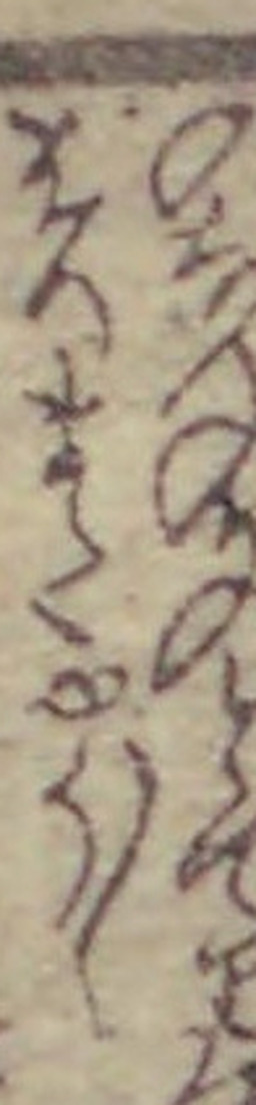はりまたやう〳〵
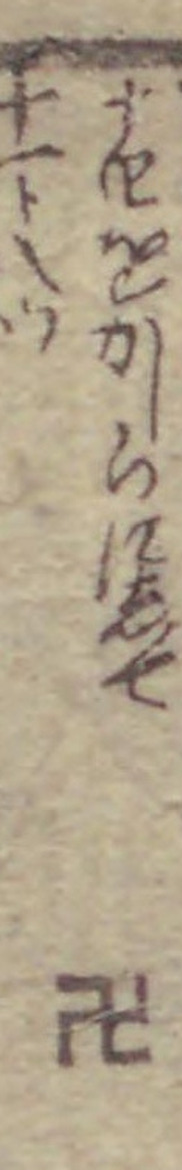十四をかしらにして
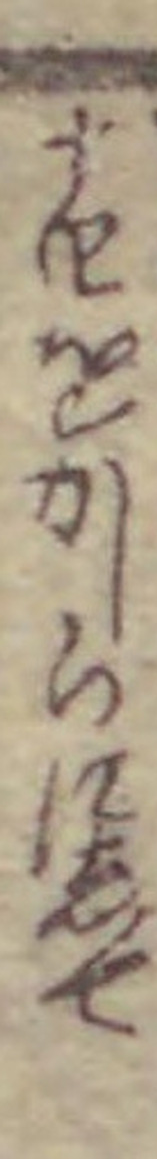十四をかしらにして
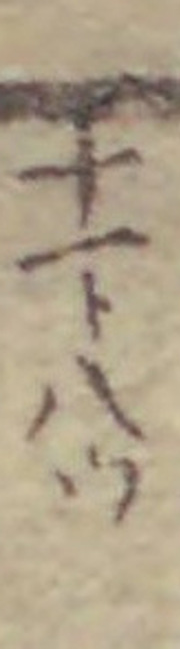十一ト八ツ
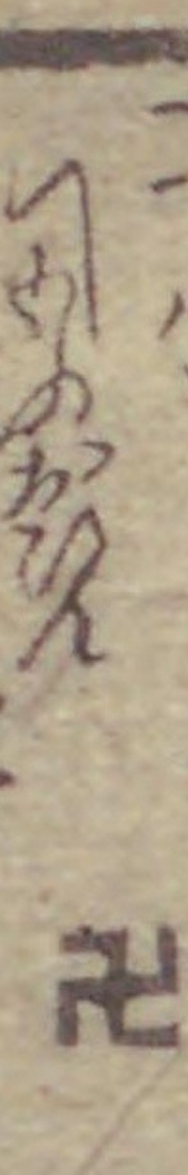〽もうおひん
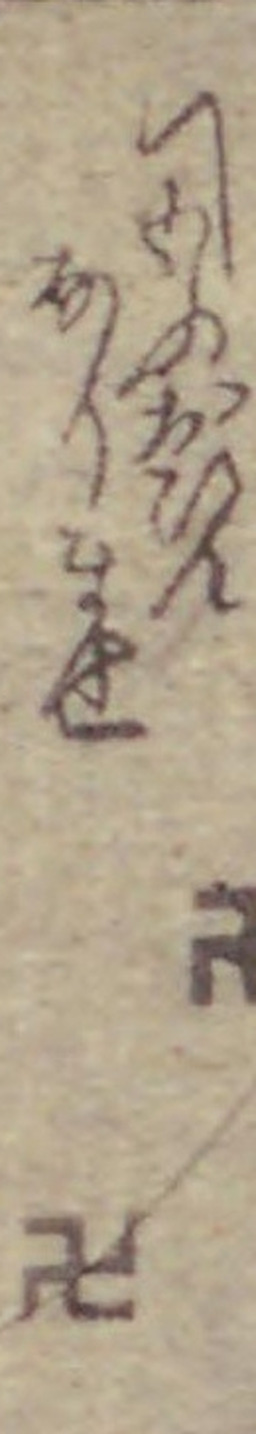なりませ
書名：思事夢濃枕 3巻
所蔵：国立国会図書館 National Diet Library, JAPAN
